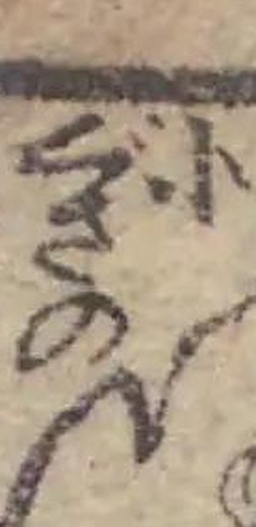ぐさの
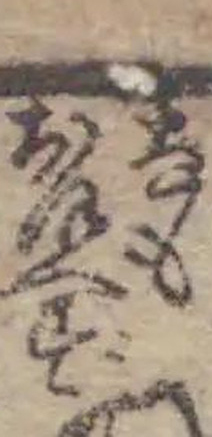おほへず
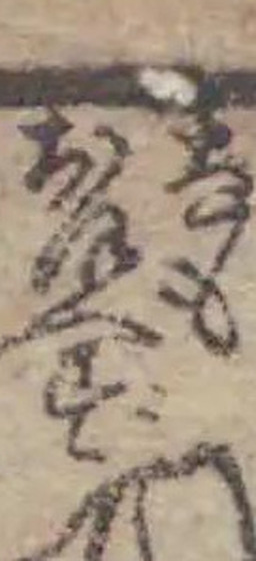おほへず
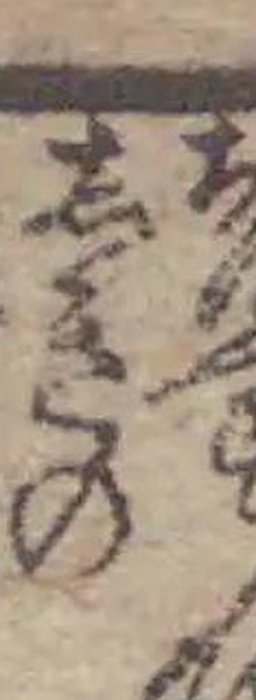しきの
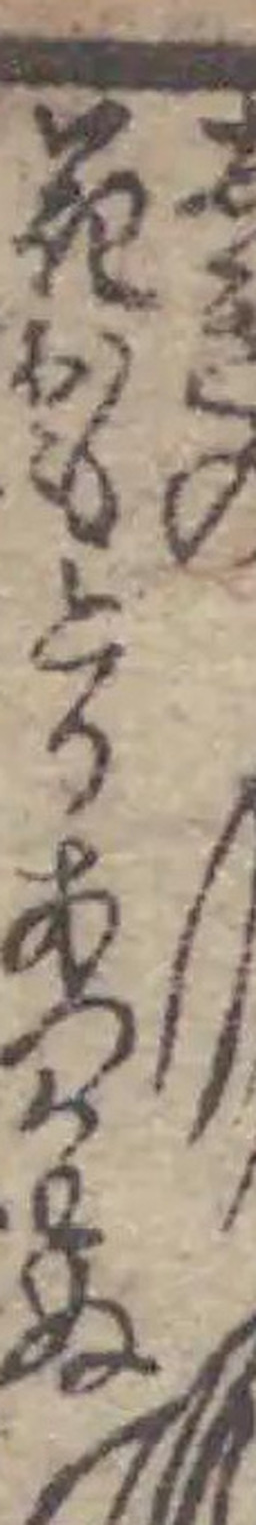花おもとりあつかわぬ
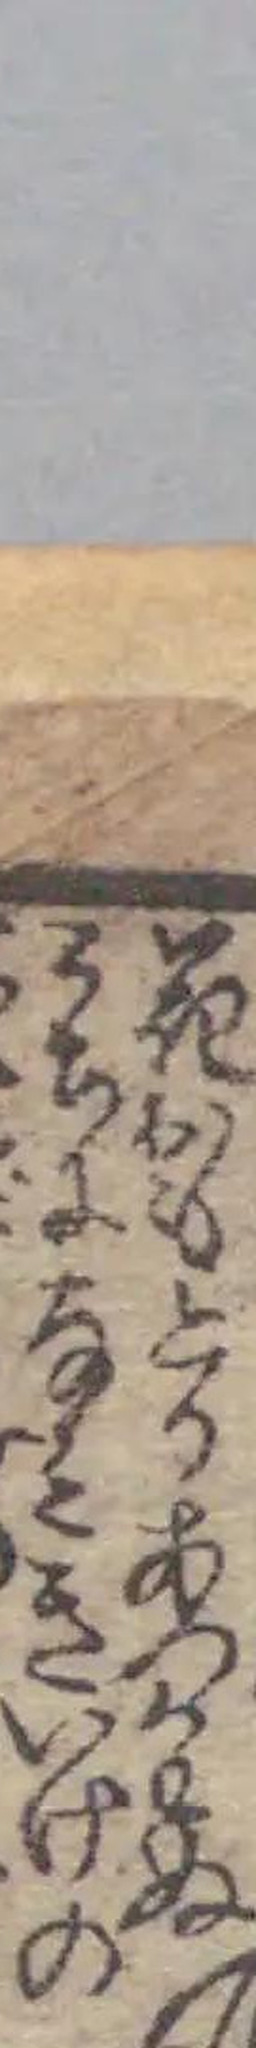うちになみきいけの
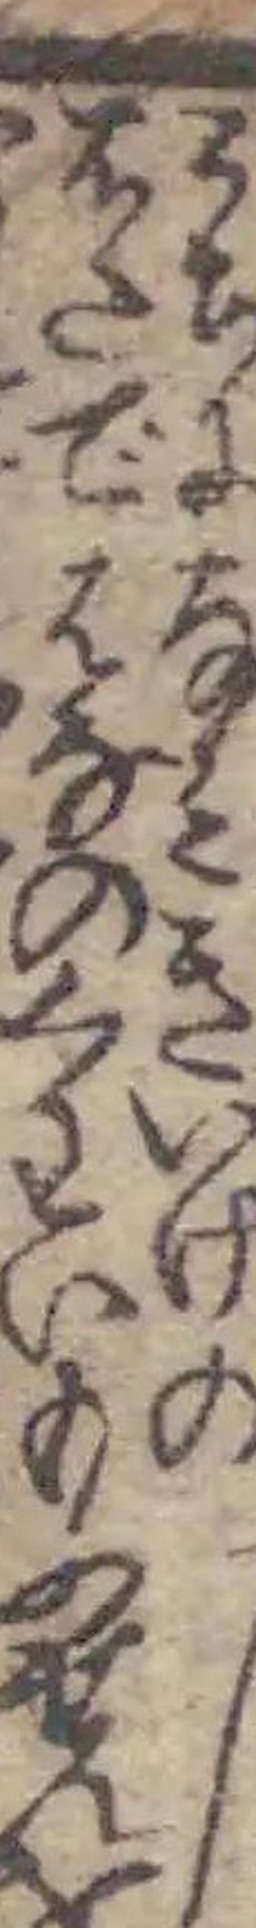はたではなのくわいもふせんを敷
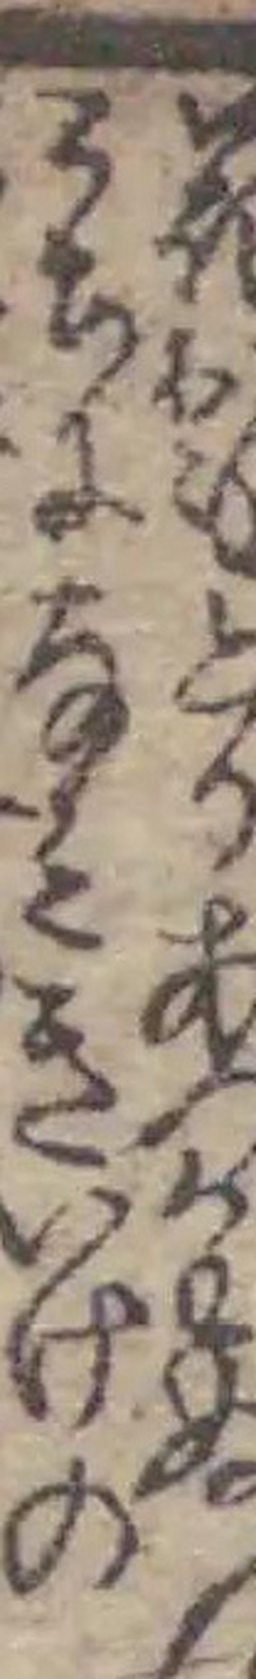うちになみきいけの
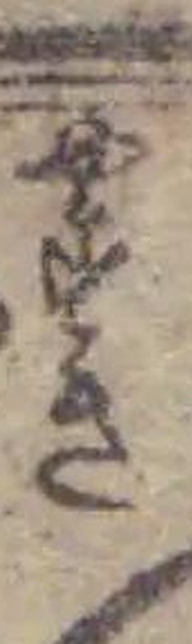やすき
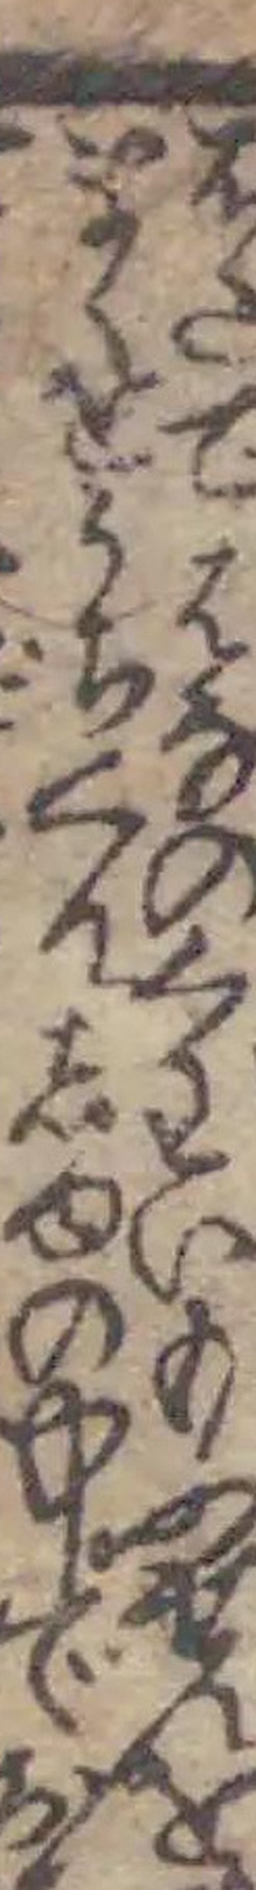まくをうちくんしゆの中でおち
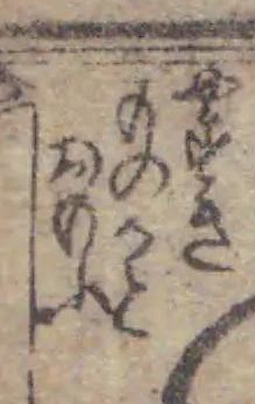おもふ
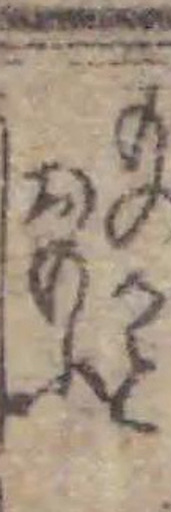ものかと
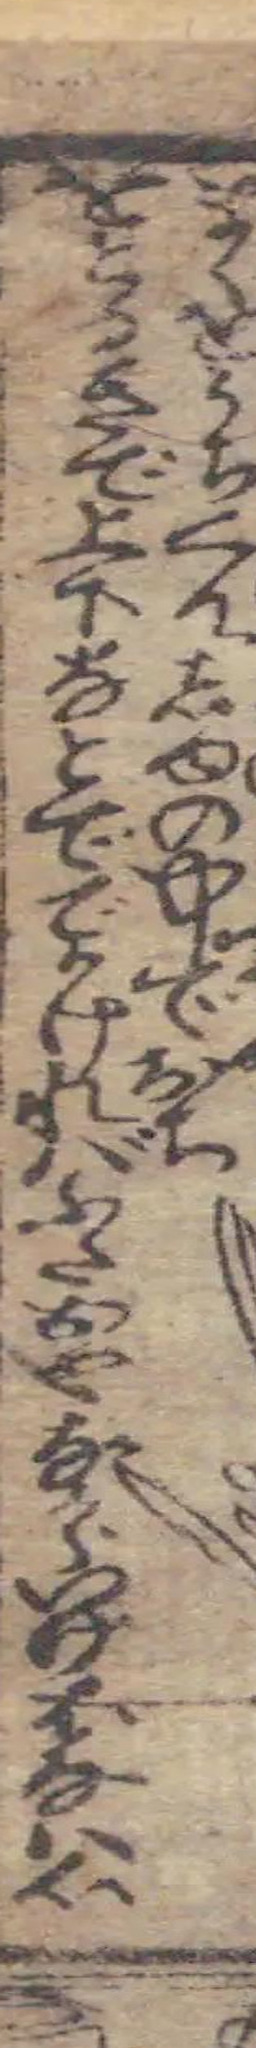をとるきで上下なとででかければふたおやなからいけはなは心

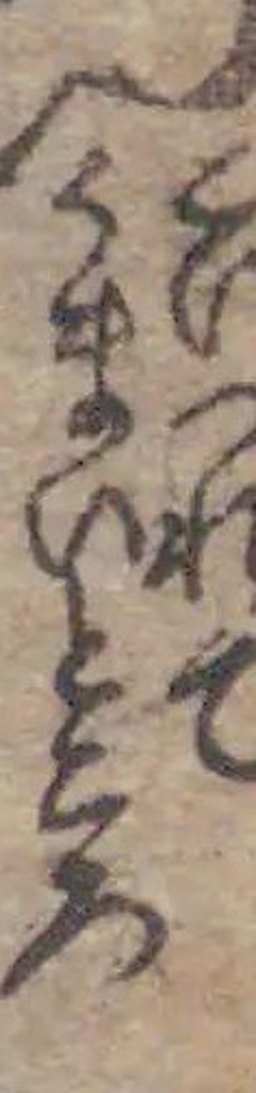うまいところ
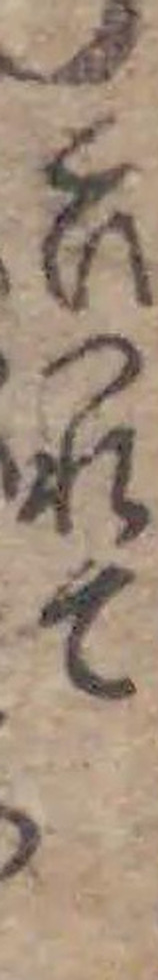こいつれて
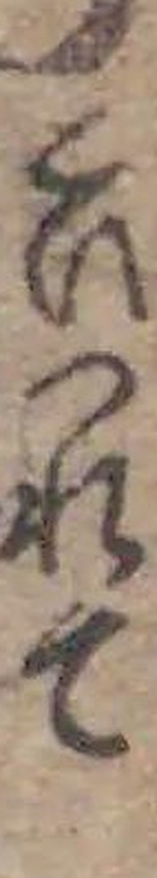こいつれて
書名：津以曽無弟の甚六 3巻
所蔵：国立国会図書館 National Diet Library, JAPAN
